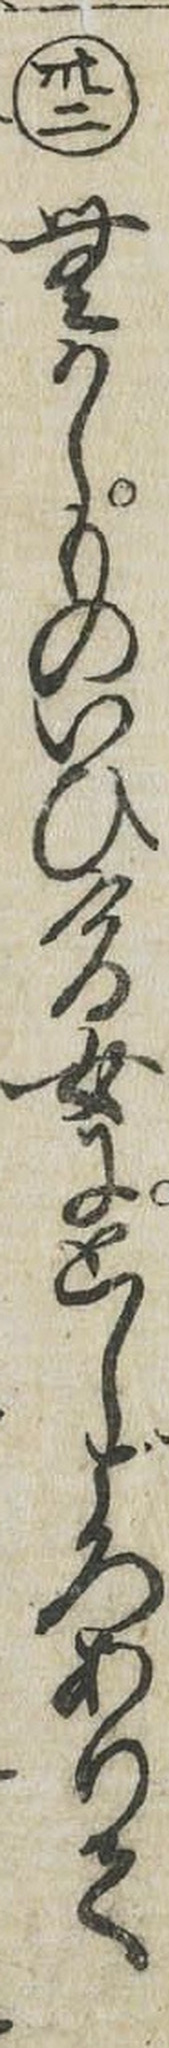(丗二)むかし。ものいひける女に。としごろありて
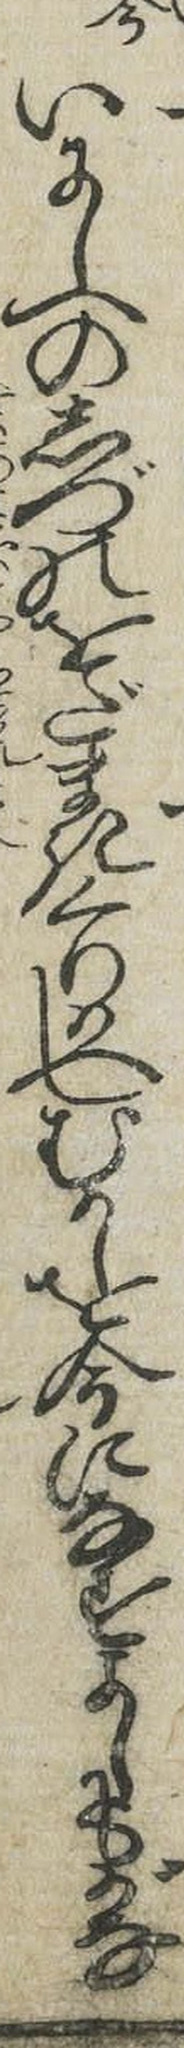古今いにしへのしづのをだまきくりかへしむかしを今になすよしもがな

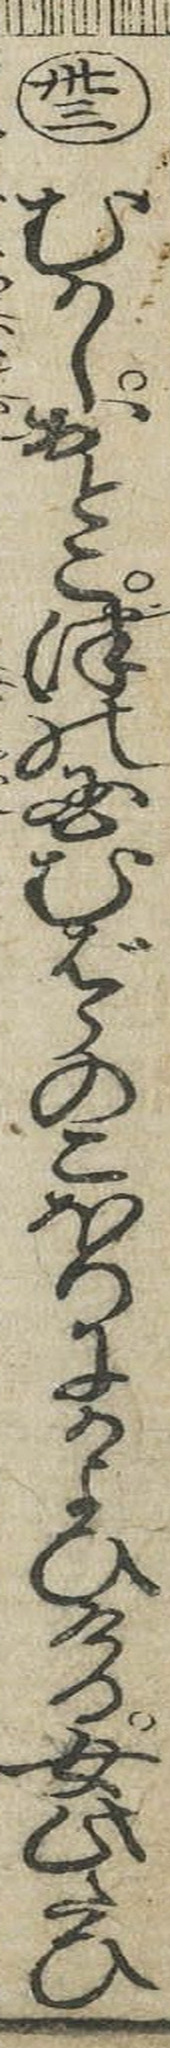(丗三)むかし。おとこ。津の国むばらのこほりにかよひける。女此たひ
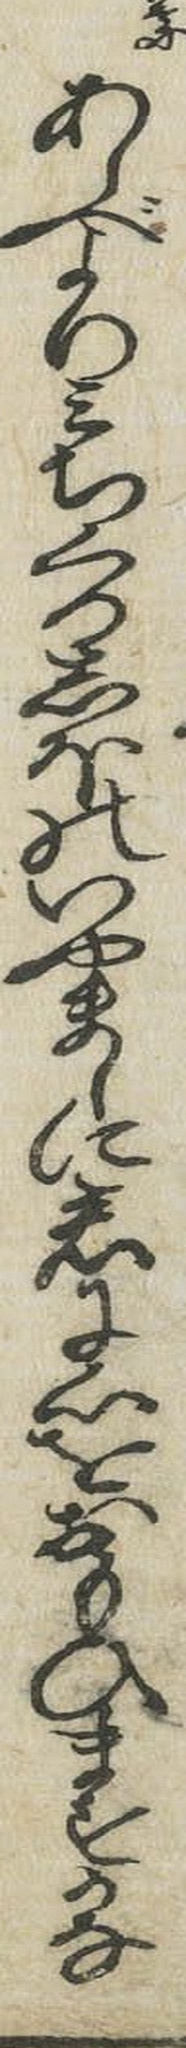万葉あしべよりみちくるしほのいやましに君に心をおもひますかな
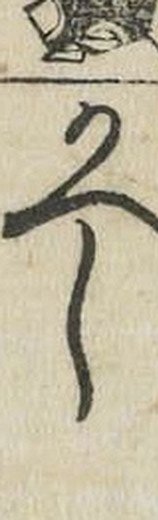かへし
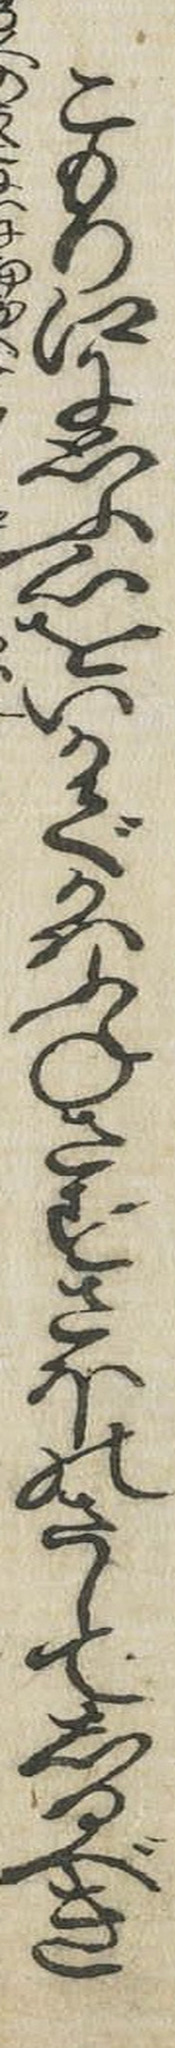こもり江に思ふ心をいかでかはふねさすさほのさしてしるべき
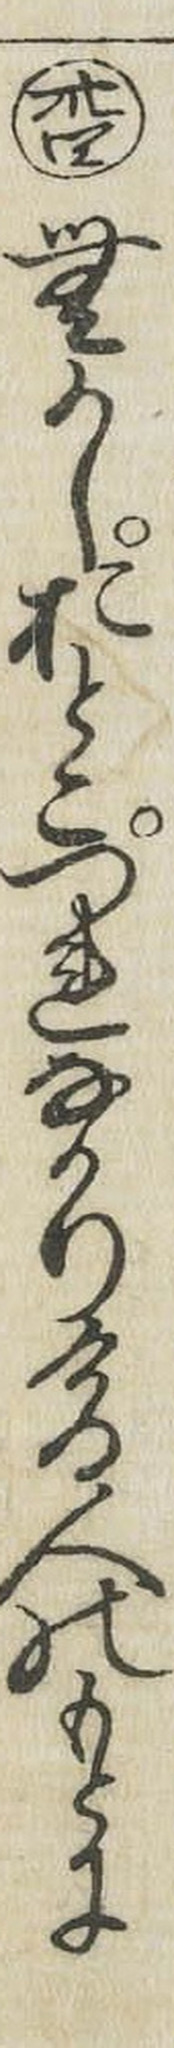(丗四)むかし。おとこ。つれなかりける人のもとに
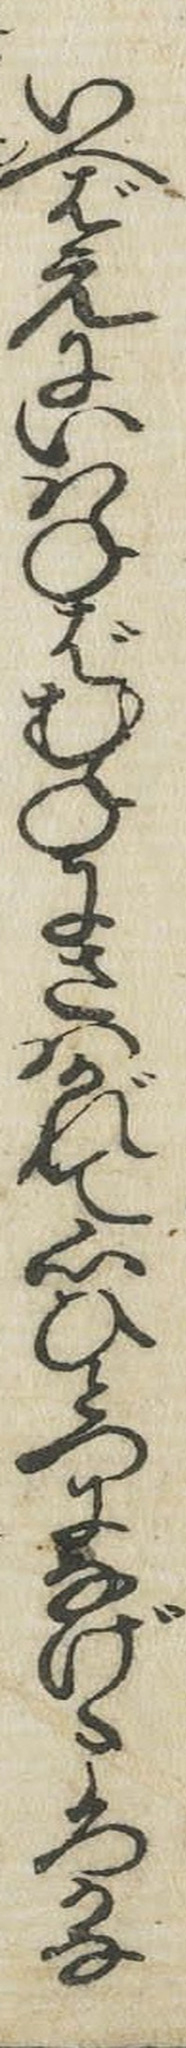いへばえにいはねばむねにさはがれて心ひとつになげくころかな
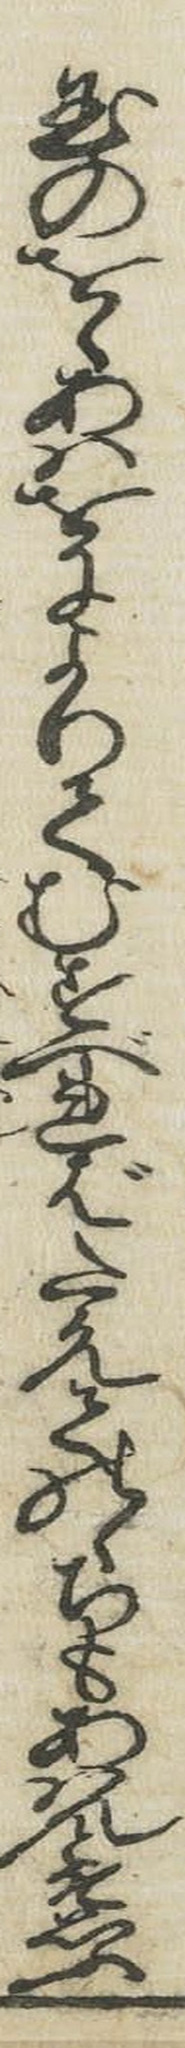玉のをゝあはをによりてむすべればたえてのゝちもあはんとそ思ふ
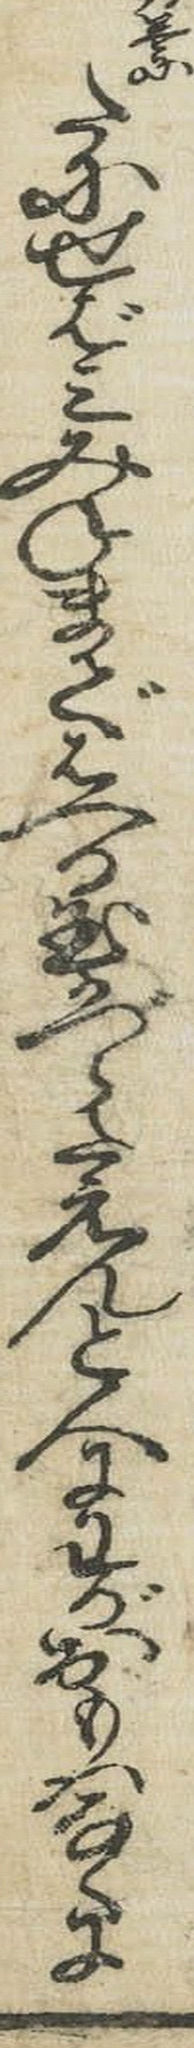万葉たにせばみみねまではへる玉かづらたえんと人にわがおもはなくに
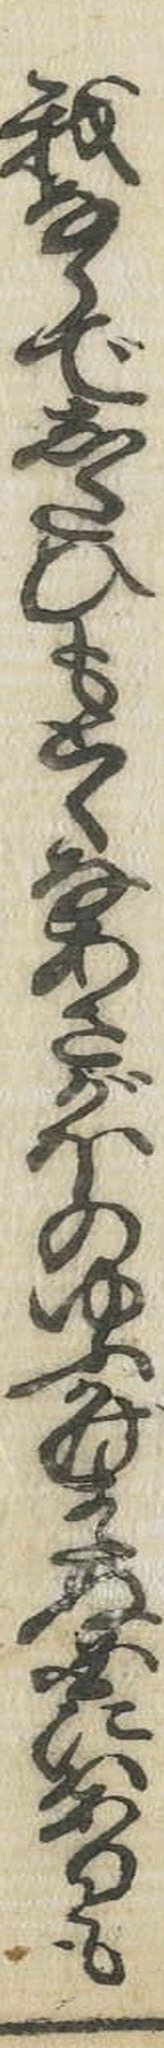我ならでしたひもとくなあさがほのゆふかげまたぬ花にはありとも
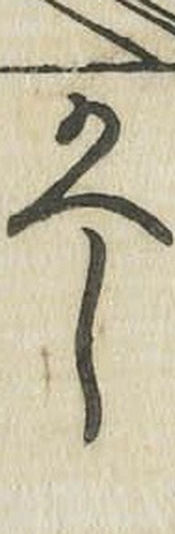かへし
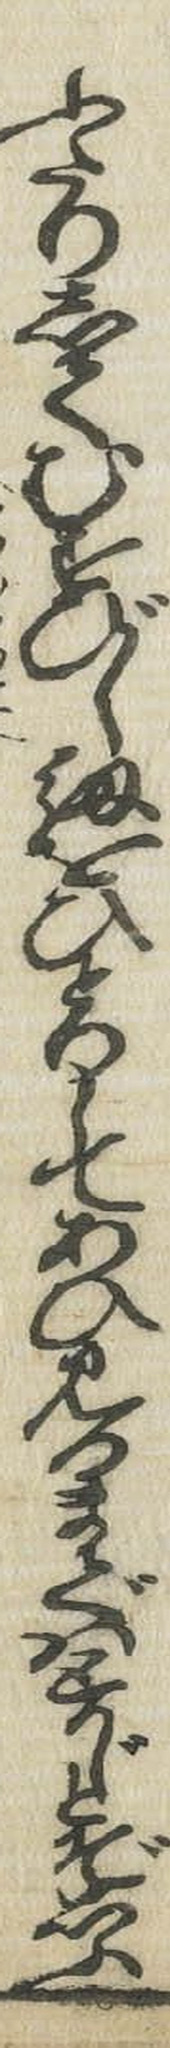ふたりしてむすびし紐をひとりしてあひ見るまではとかじとぞ思ふ
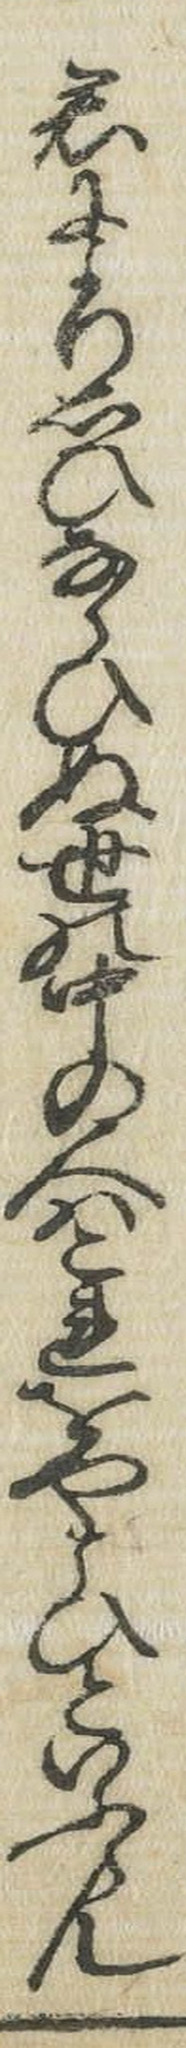君により思ひならひぬ世の中の人はこれをやこひといふらん
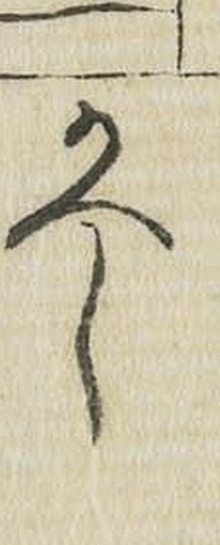かへし
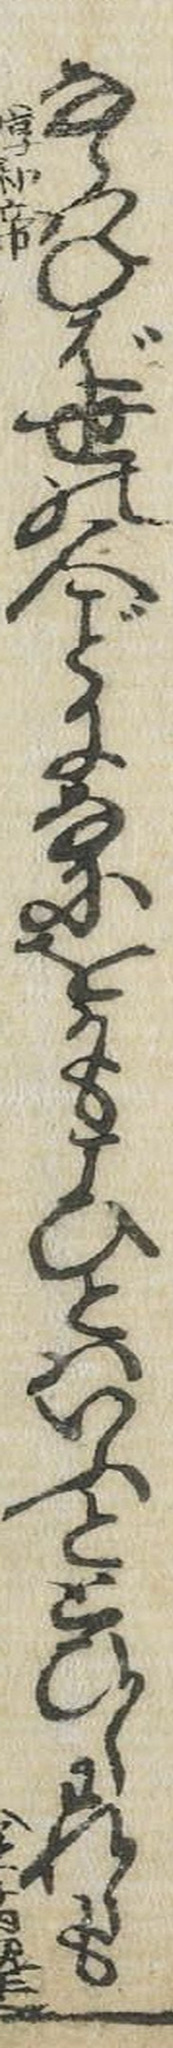ならはねば世の人ごとになにをかもこひとはいふととひしわれしも
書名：新板絵入伊勢物語 : かうしやく付 2巻 上
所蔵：東京学芸大学教育コンテンツアーカイブ
